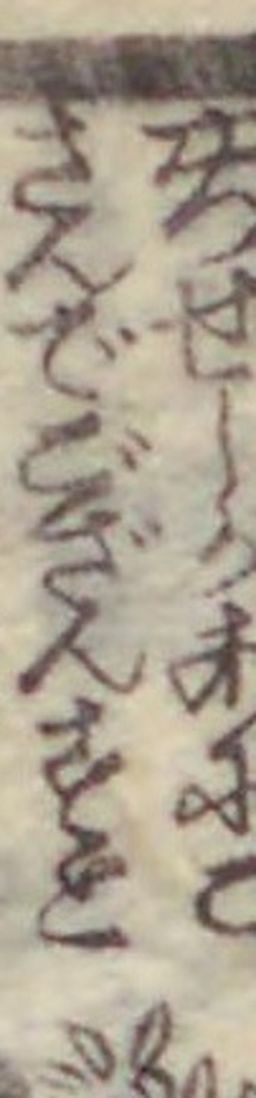さんでござんすと
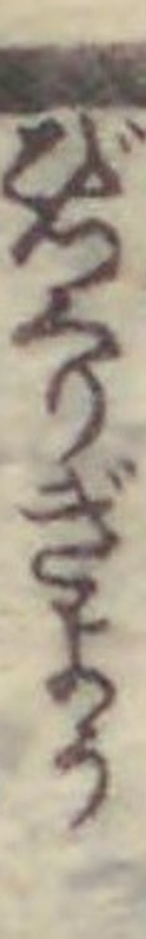びつくりぎよう
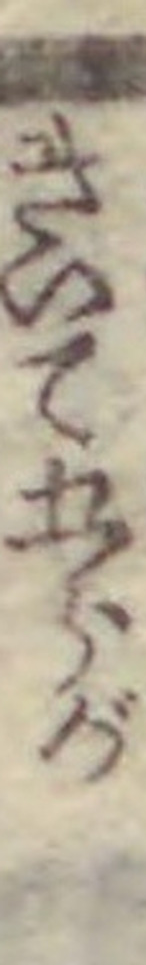きいて五郎が
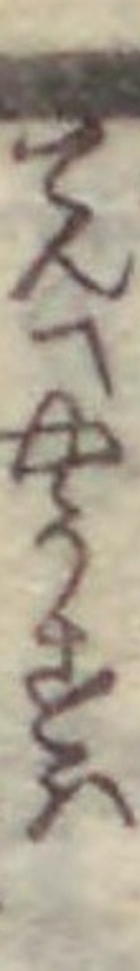てん〽やうすは
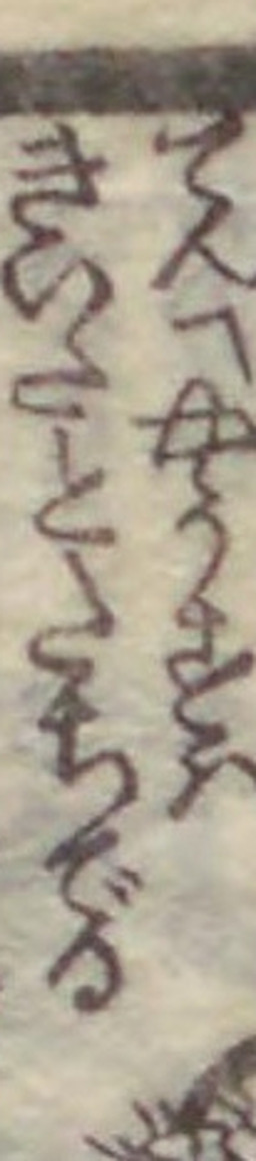きいたとたちでる
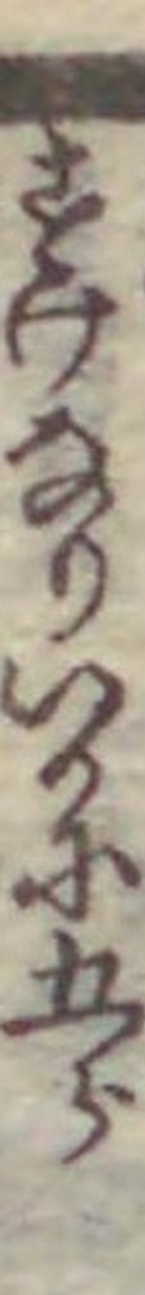すけなりいかに五郎
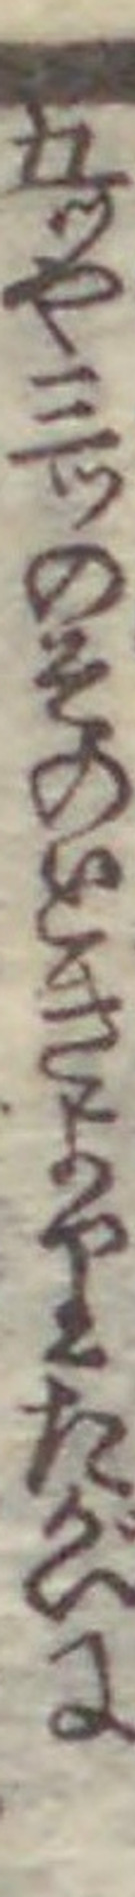五つや三つのそのときよりたがいに
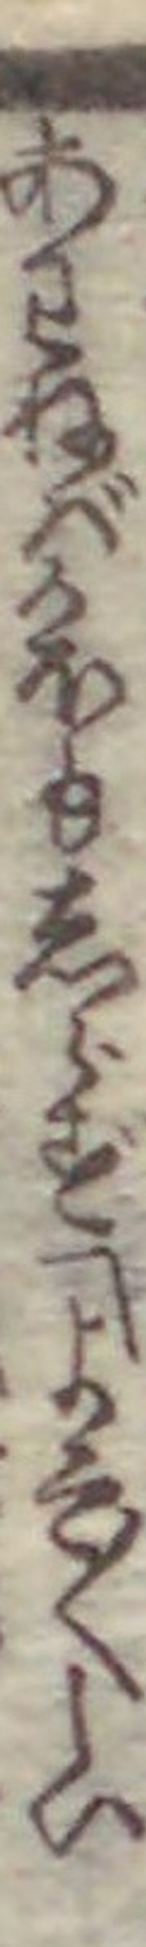あわねばかほもしらず〽よそ〳〵しい
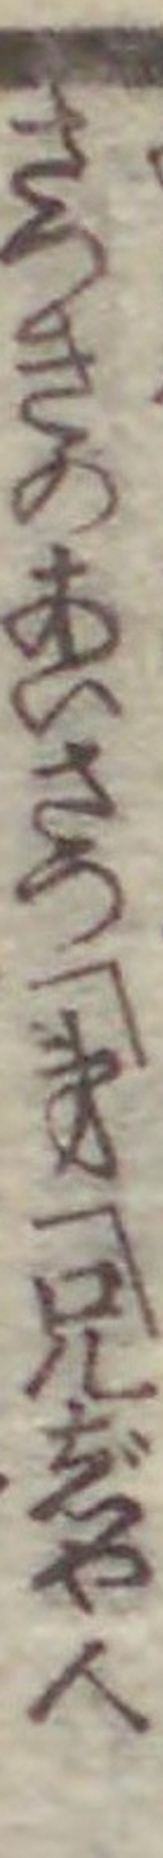さつきのあいさつ〽弟〽兄じや人
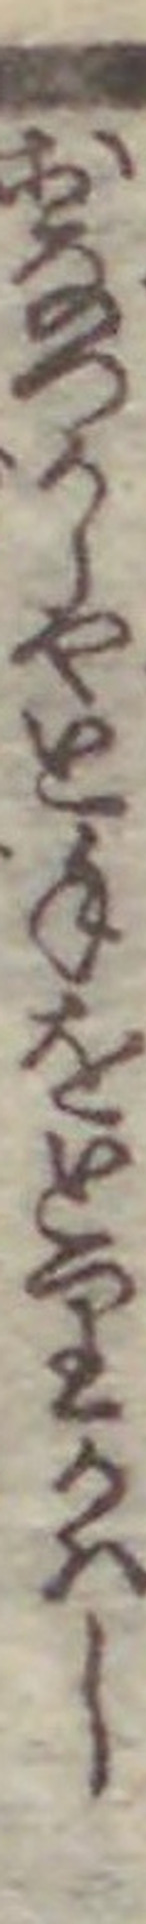おなつかしやとてをとりかはし
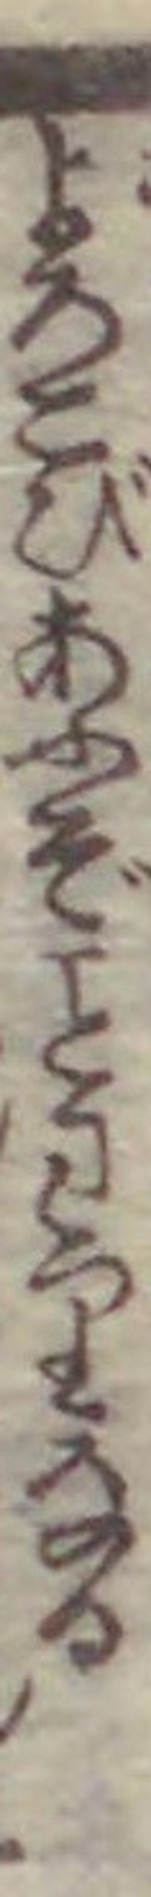よろこびあふぞことわりなる
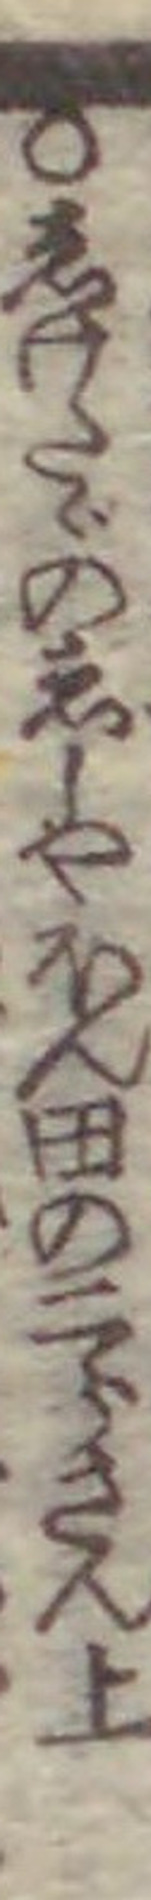○しけたゞのしやほん田の二郎さん上
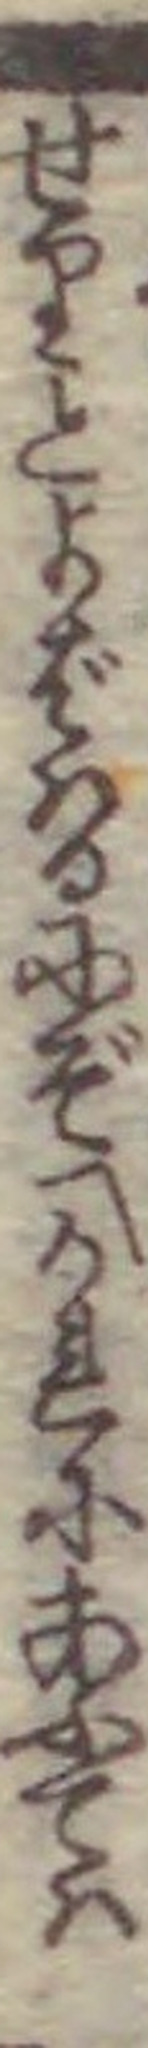せりとよばはるにぞ〽かれにあふては
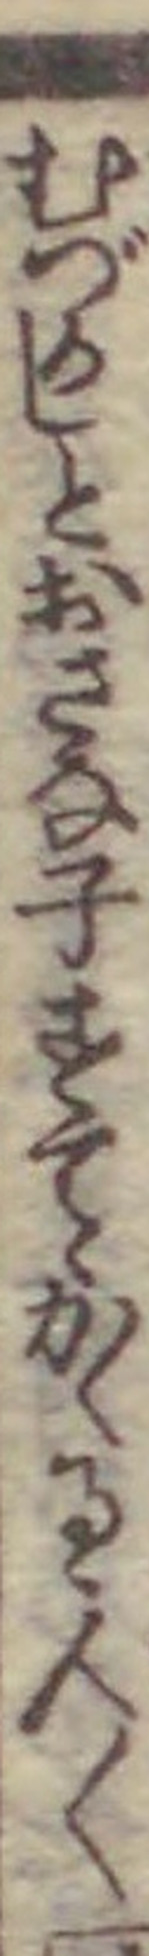むづかしとおさな子すてゝかくるゝ人〳〵つづき
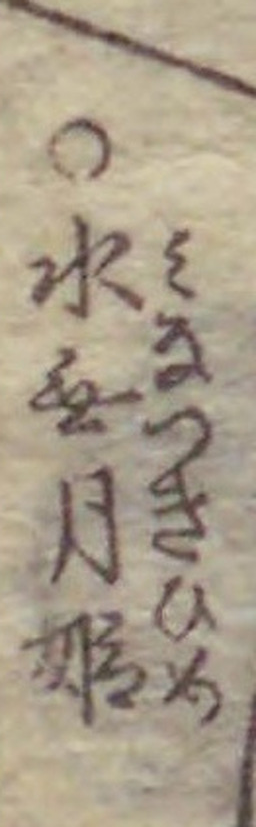○水無月姫

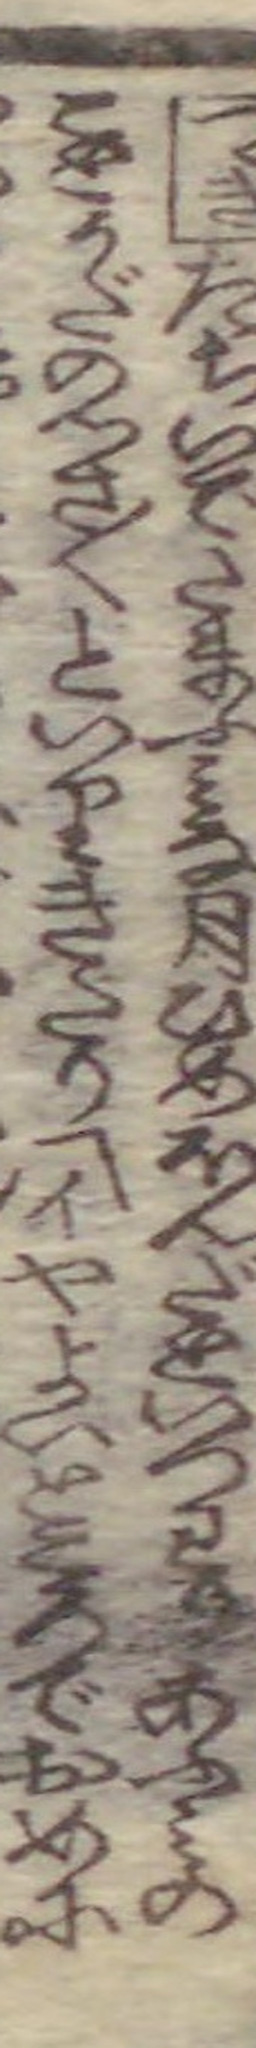ことうだのつさ〳〵といりきたり〽イヤよいところでおめに
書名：大時代唐土化物 3巻. 曽我太夫染
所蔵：国立国会図書館 National Diet Library, JAPAN
